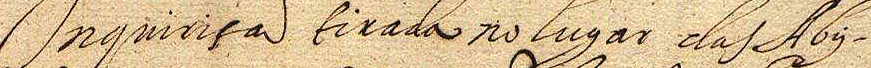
Inquisisaõ tirada no lugar das Aby
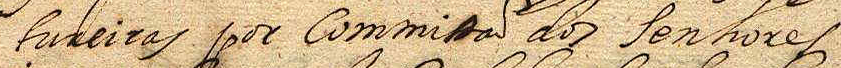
tureiras por commissaõ dos Senhores
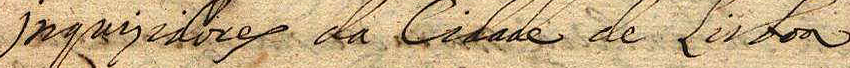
jnquizidores da Cidade de Lisboa
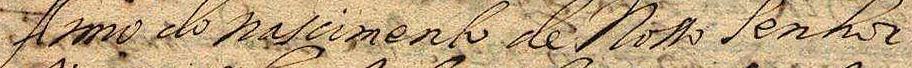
Anno do nascimento de Nosso Senhor
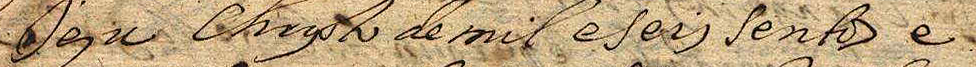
Iezu Christo de mil e seissentos e
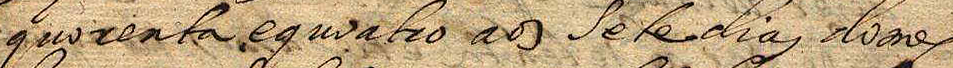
quorenta e quoatro aos sete dias do mes
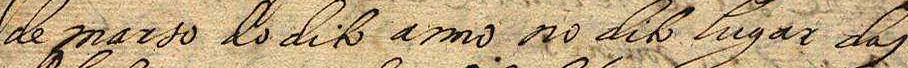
de marso do dito anno no dito lugar das
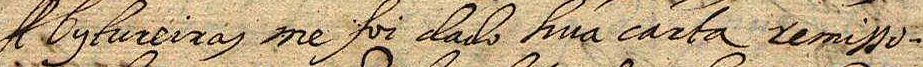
Abytureiras me foi dado huā carta remisso
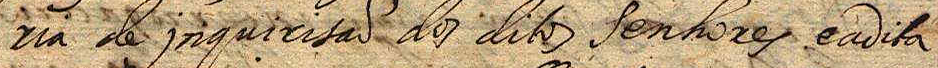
ria de jnquirisaõ dos ditos Senhores e a dita
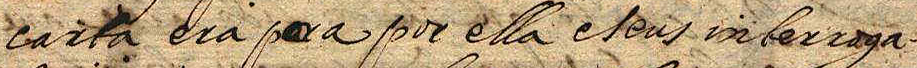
carta era pera por ella e seus interroga
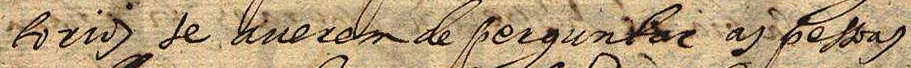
torios se auerem de perguntar as pessoas
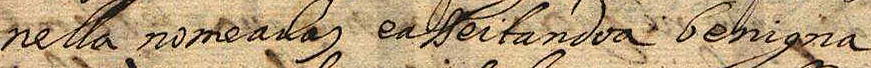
nella nomeadas e asseitandoa benigna
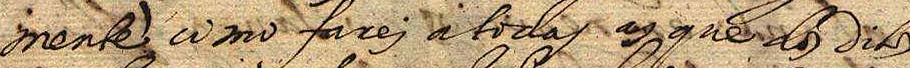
mente como farej a todas as que dos ditos
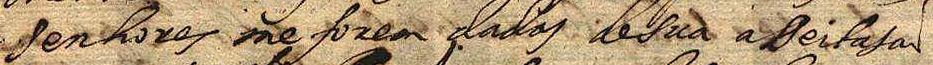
senhores me forem dadas de sua asseitasaõ
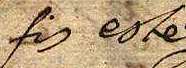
fiz este
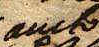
aucto
